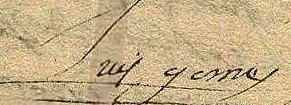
Luis Gomes
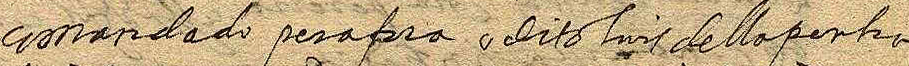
comandado pera fora o dito Luis della penha
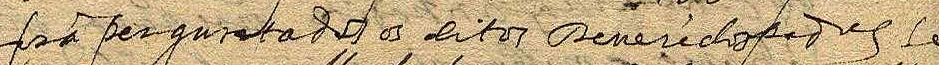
forã perguntados os ditos Reverendos padres se
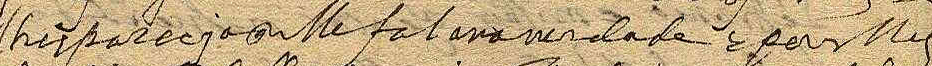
lhes parecja q̄ elle falava verdade E per elles
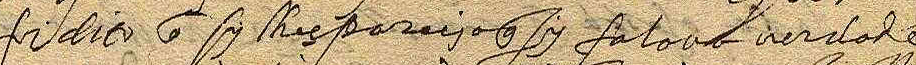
foi dito q̄ sy lhes parecja q̄ sy falava verdade
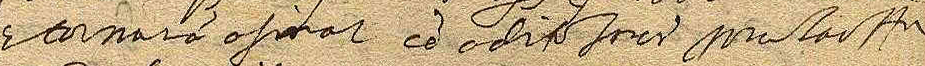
e tornarã asinar cō o dito snor Nicolao Au
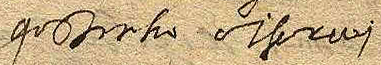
gostinho o iscrevj
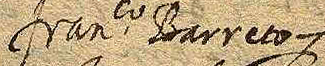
franco. Barreto
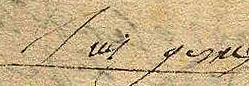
Luis Gomes
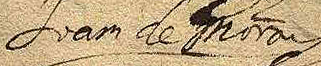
Joam de Morais
